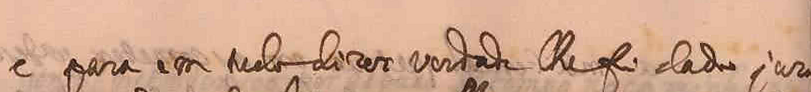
e para em tudo dizer verdade lhe foi dado jura
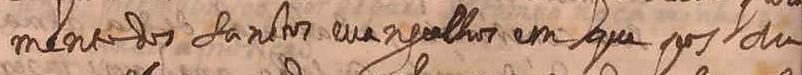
mento dos sanctos euangelhos em que pos sua
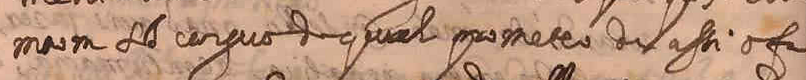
maom sob carguo do qual prometeo de assi o fa
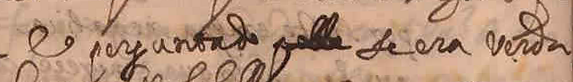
E perguntado pella se era verda
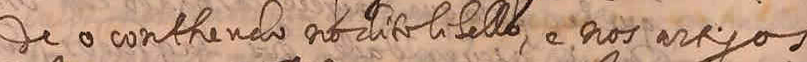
de o contheudo no dito libello, e nos artigos
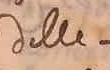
delle
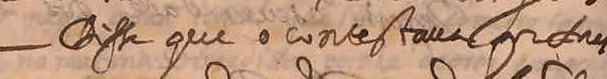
Disse que o contestaua por tres
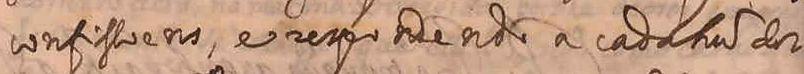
confissoens, e respondendo a cada hū dos
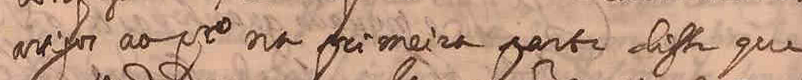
artigos ao pro na primeira parte disse que
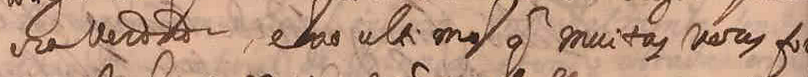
era uerdade, e ao ultimo q̄ muitas uezes foi
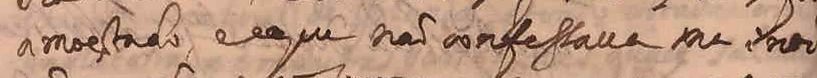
amoestado, e _ que naõ confessaua ma inte
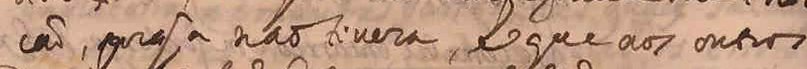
çaõ, porq̄ a não tiuera, e que aos outros
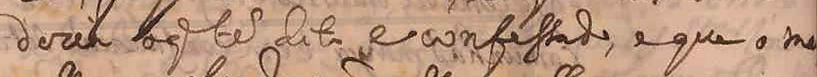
dizia o q̄ tē dito e confessado, e que o me
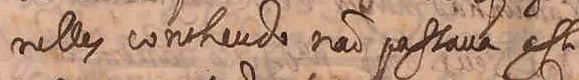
nelles contheudo naõ passaua assi
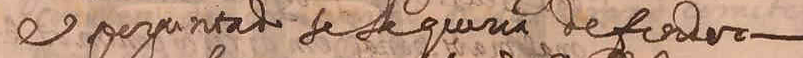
e perguntado se se queria defender
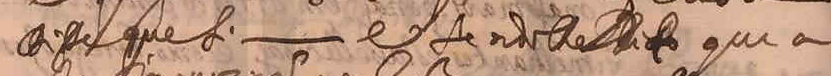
Disse que si - e sendolhe dito que a
